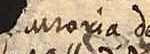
usaria de
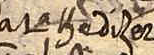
a 1a lhe dizer
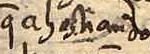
q̄ a hostia do
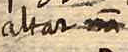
altar nā
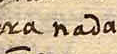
era nada
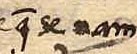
e q̄ se nam
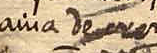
auia de crer
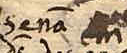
senā em
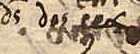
d̄s dos çeos
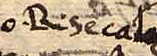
o .R. se cala
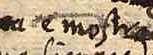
_a e mostr_
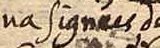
ua Signaes de
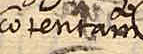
cōtentamto
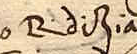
o R. dizia
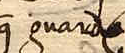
q̄ guarda
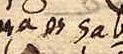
ua os sab
